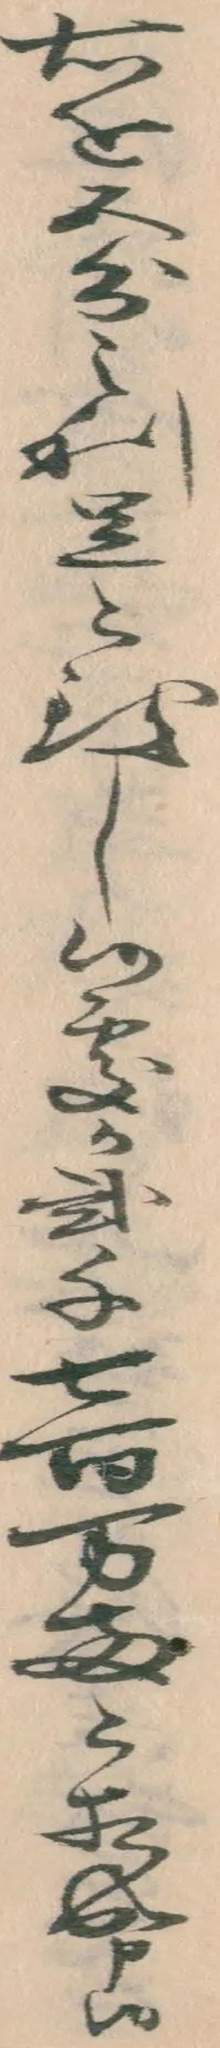右を五分の利足と致し候処か弐千七百万両と相成申候
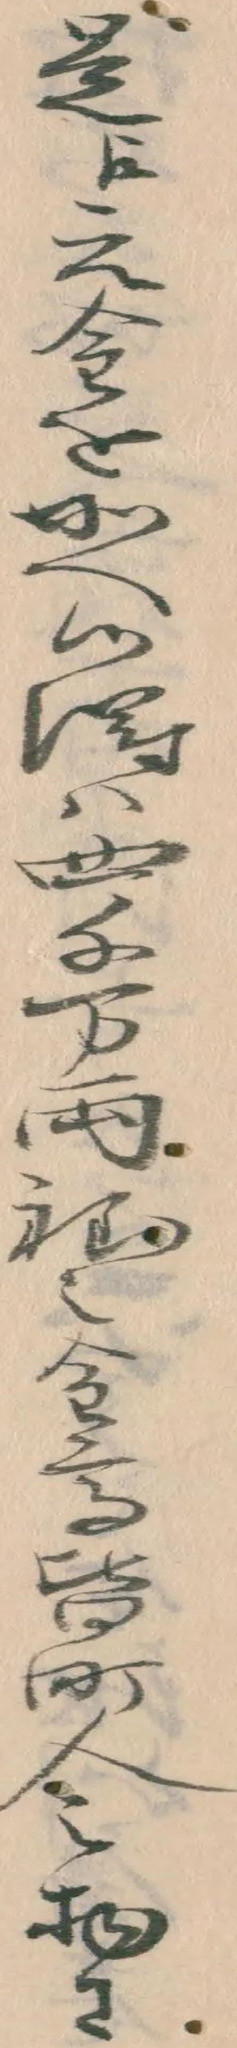是え元金を加へ候得は四千万両程之金高皆町人之物に
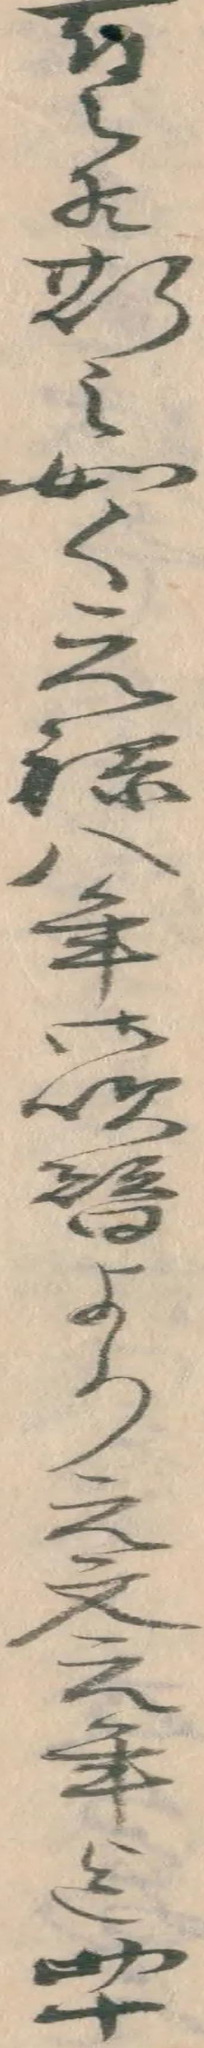有之候斯之如く元禄八年御吹替より元文元年迄四十
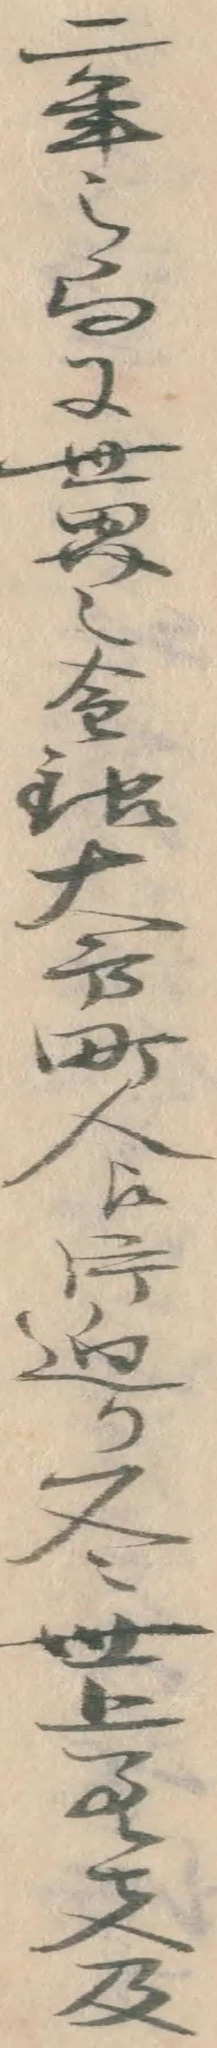二年之間に世界之金銀大方町人え片迥？り又々世上差支及
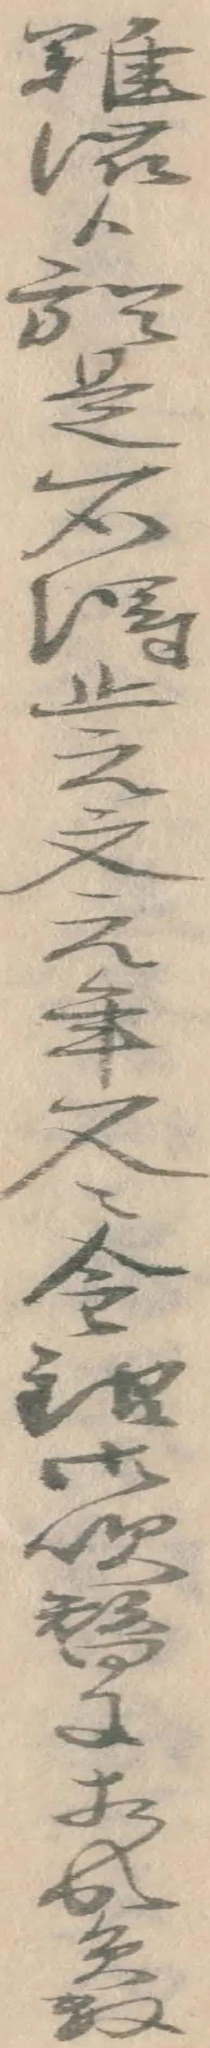難渋候於是不得止元文元年又々金銀御吹替に相成員数
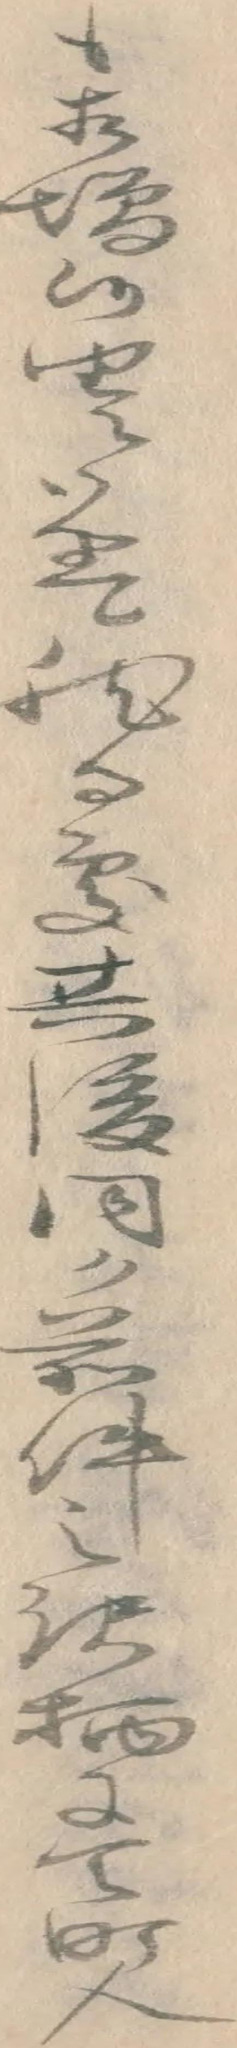も相増候由に御坐候然る処其後同く前件之訳柄にて町人
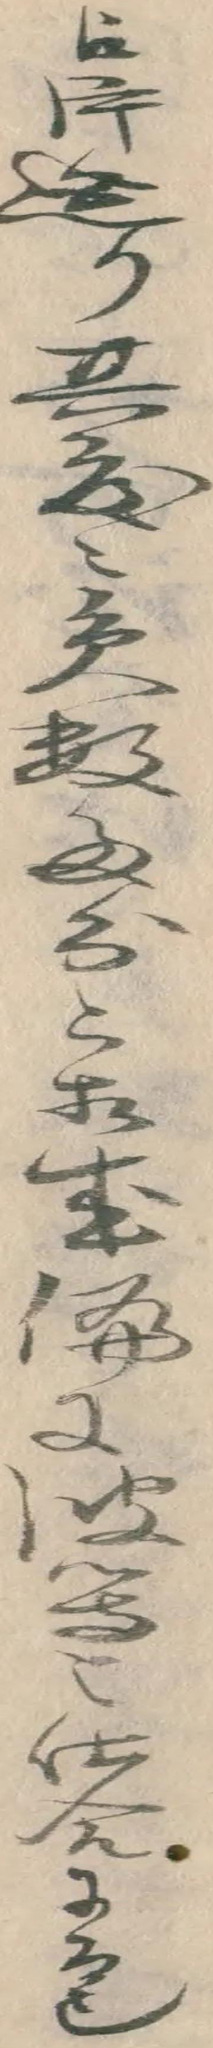え片迥？り其度々員数多分と相成偏に彼等之仕合に而已
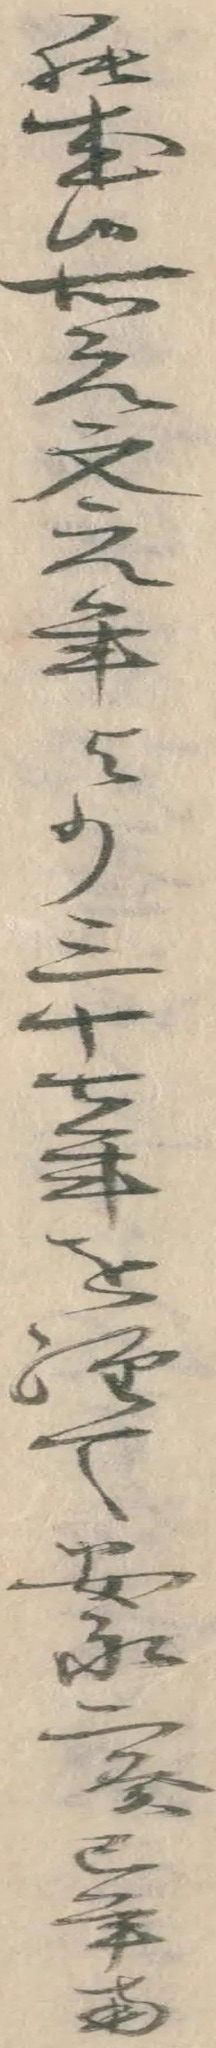罷成候右元文元元年より三十七年を経て安永二癸巳年両
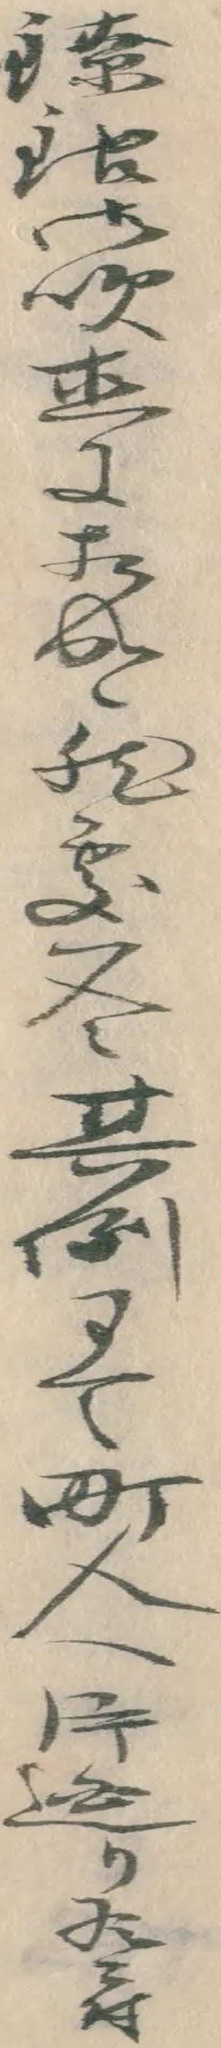鐐銀御吹直に相成候然処又々其例にて町人へ片迥？り候に付

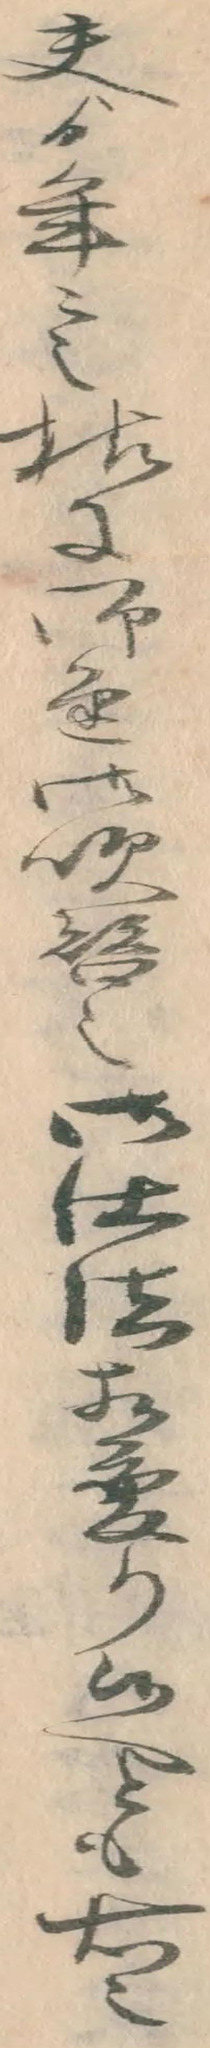夫ゟ年々之様に師？金御吹替之御仕法相変り候へとも右之
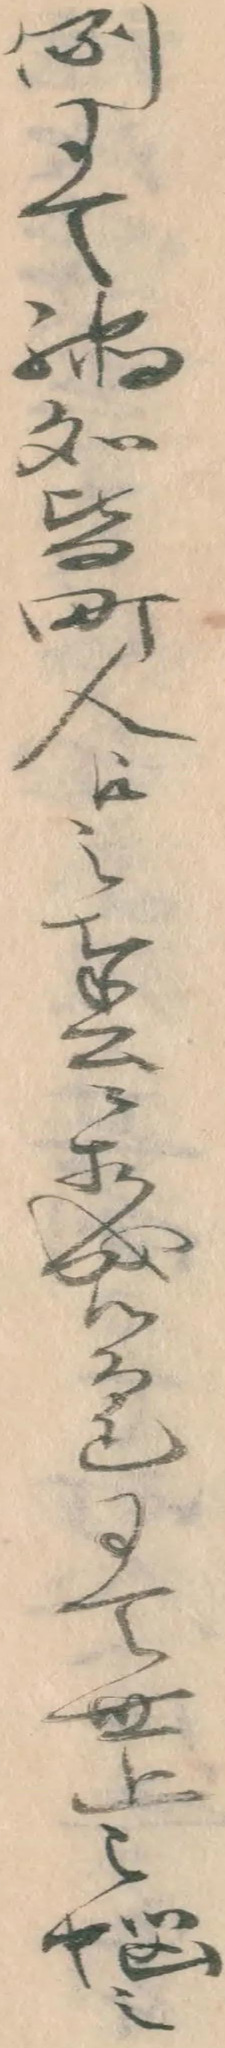例にて諸処皆町人え之奉公に相成候而已にて世上の悩之
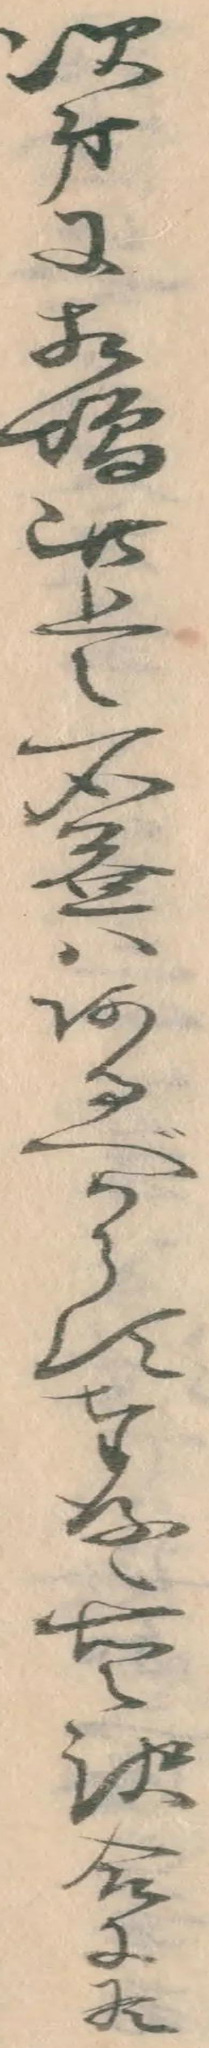次第に相増此上之不益はあるべからす奉存候右之訳合に候
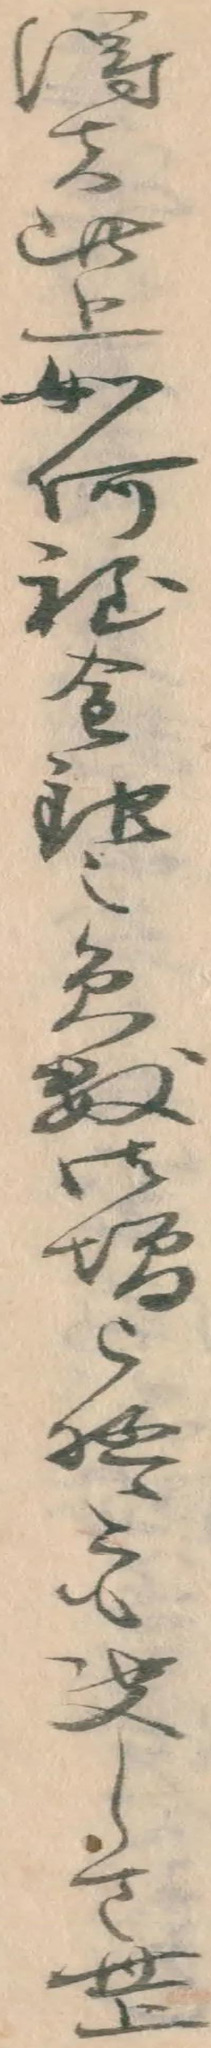得は此上如何程金銀之員数御増被遊候とも決して世上
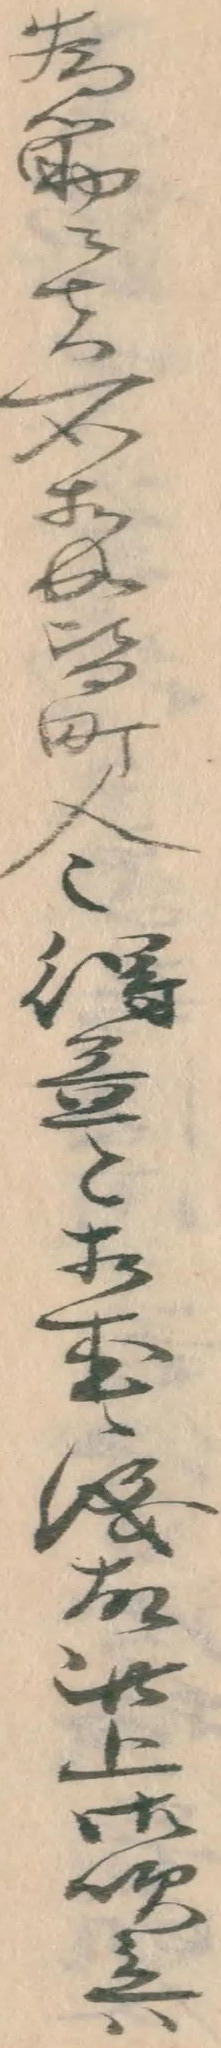為筋には不相成皆町人之得益と相成候儀故此上御吹立は
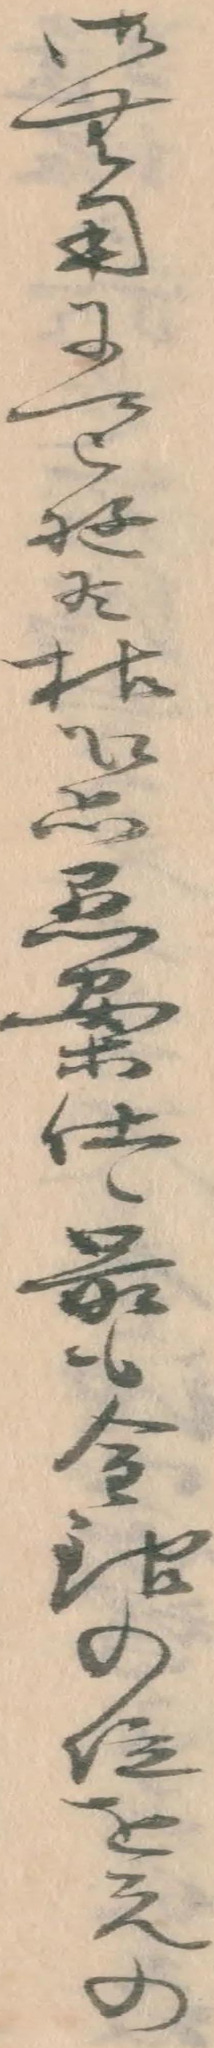御無用に可被遊候様乍恐愚仕候最も金銀の位を元の
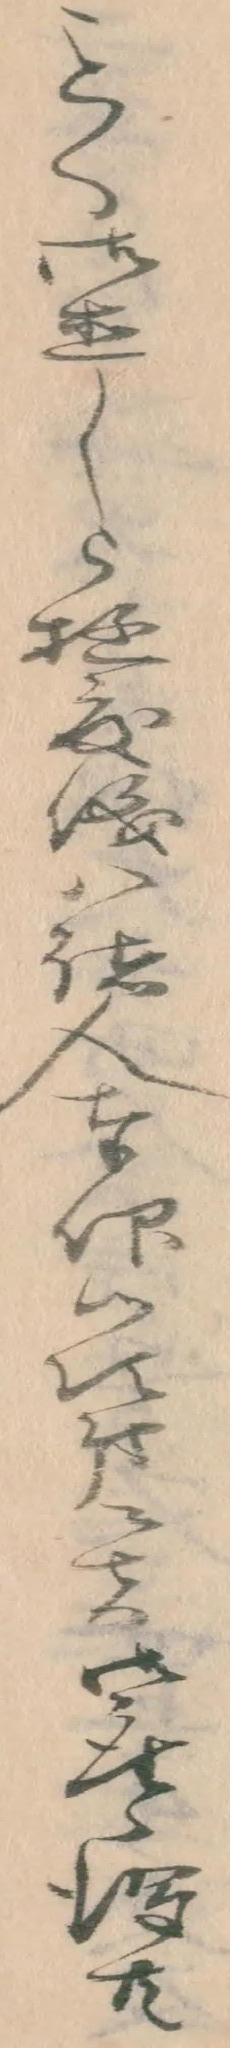ことく御直し被遊度儀は諸人奉仰候次第には御座候得共
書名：斎庭之穂
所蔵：国立国会図書館 National Diet Library, JAPAN
